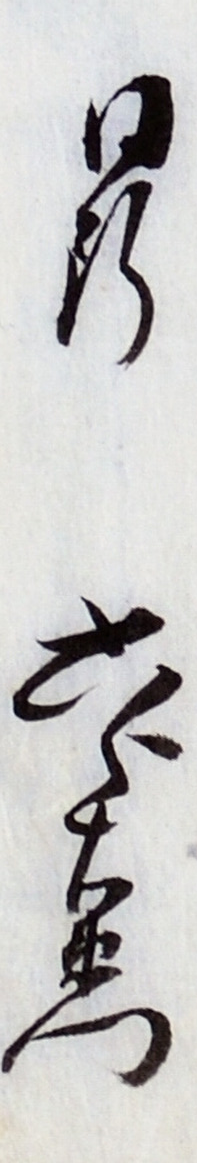同断六郎右衛門
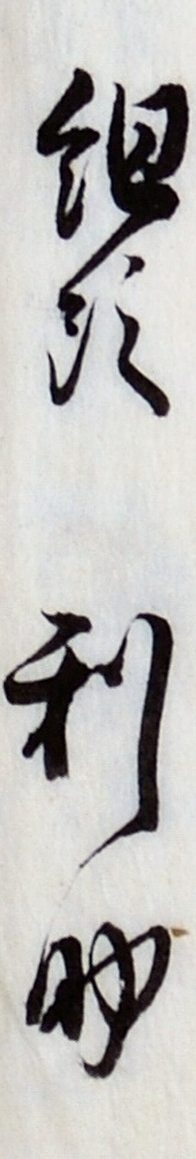組頭利助
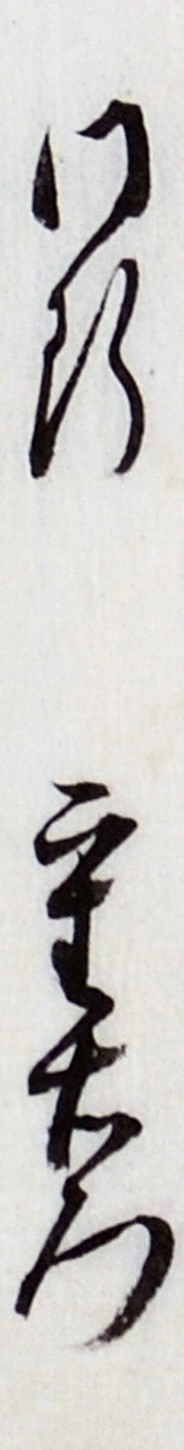同断重右衛門
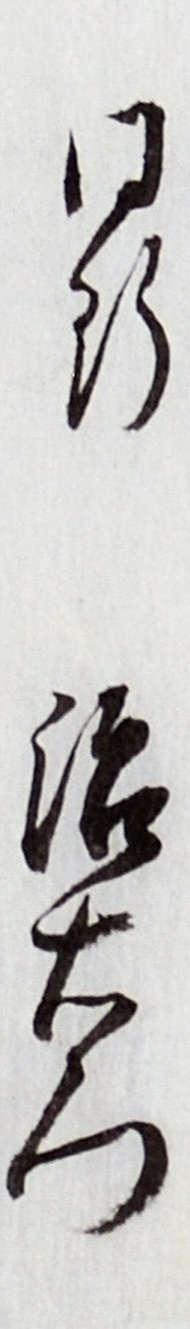同断治右衛門
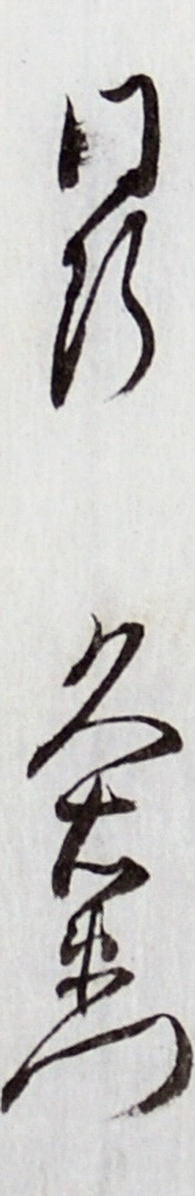同断久右衛門
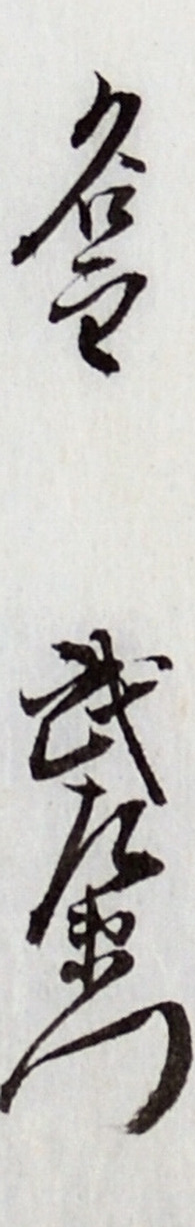名主武左衛門
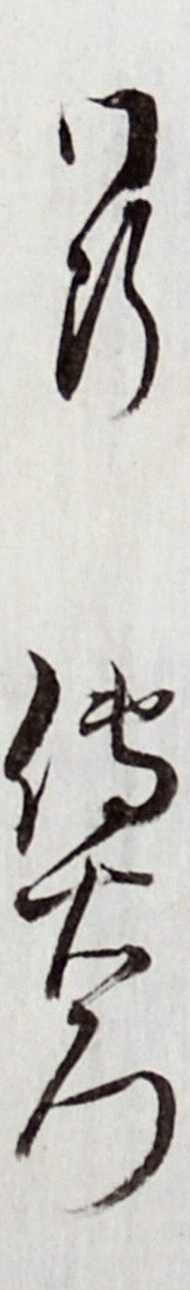同断伝右衛門
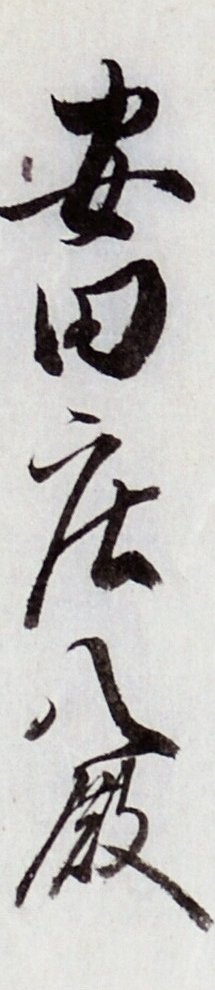安田庄八殿
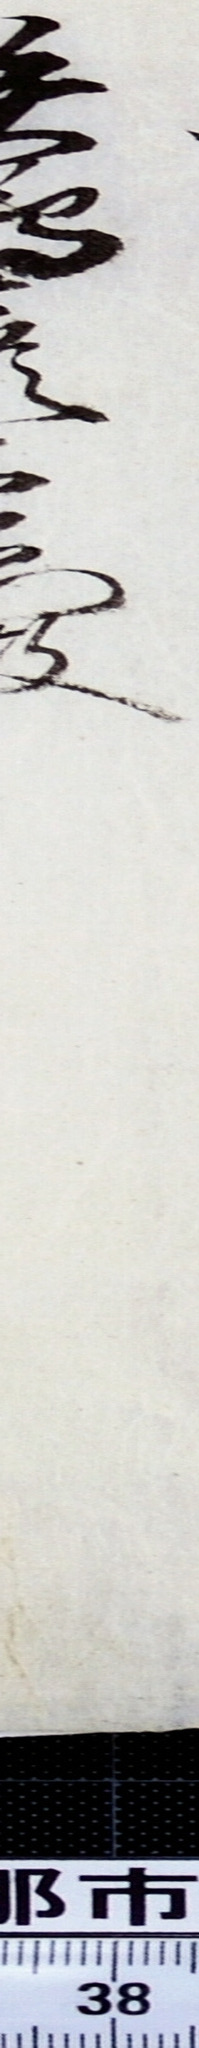矢嶋彦右衛門殿
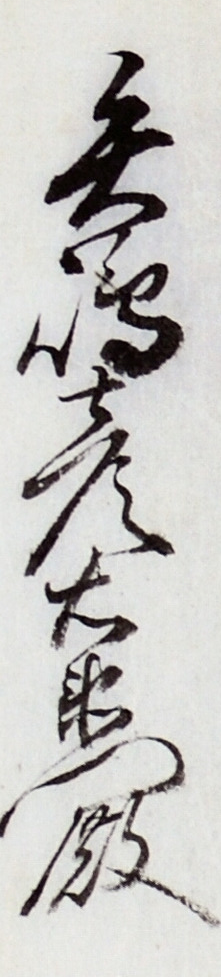矢嶋彦右衛門殿
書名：御林御竹藪証文控
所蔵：伊那市立高遠町図書館・合同会社AMANE
